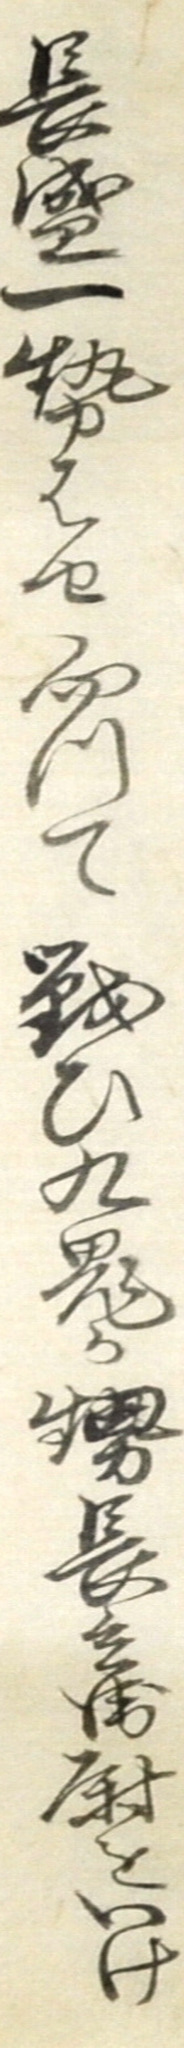長盛一勢はせ向つて戦ひ九鬼か甥長兵衛尉をいけ
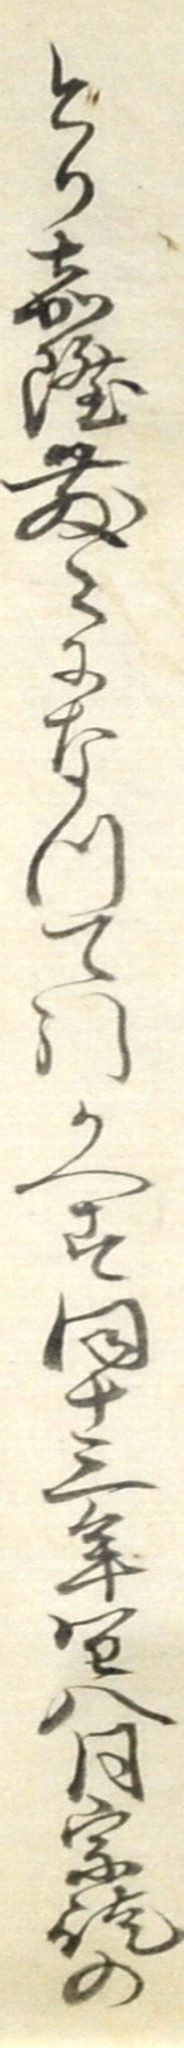とり嘉隆散々になつて引かへす同十三年閏八月宗徒の
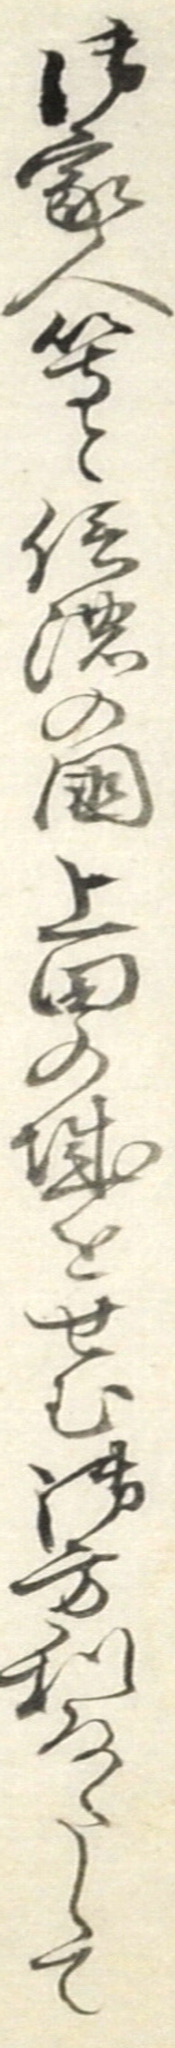御家人等と信濃の国上田の城をせむ御方利なくして
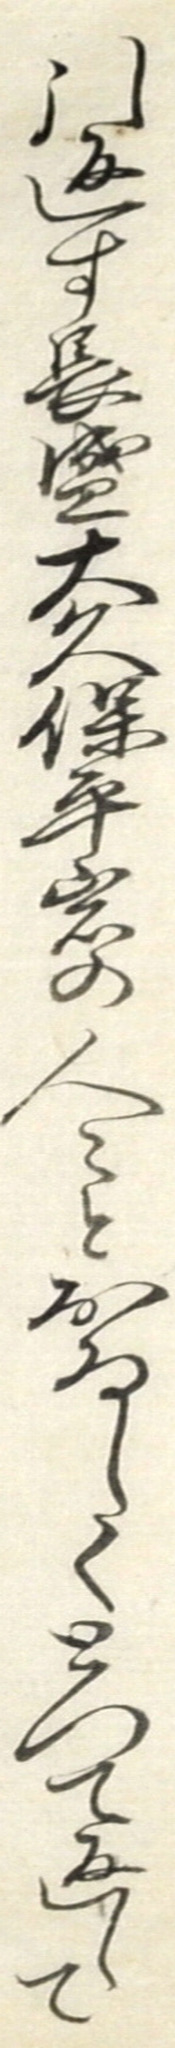引返す長盛大久保平岩の人々とおなしくとつて返して
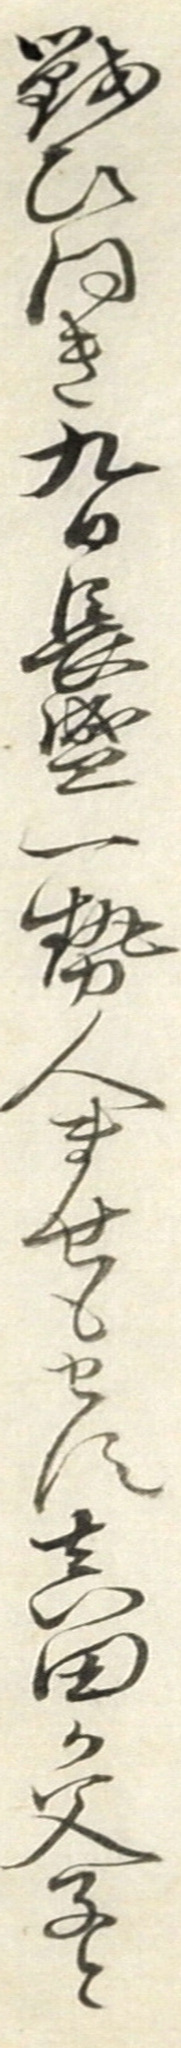戦ひ同き九日長盛一勢人ませもせす真田か父子と
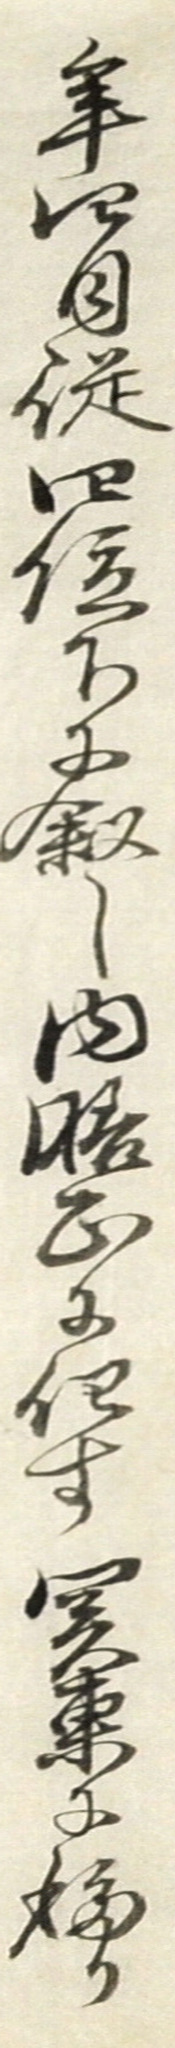年四月従四位下に叙し内膳正に任す関東に移り
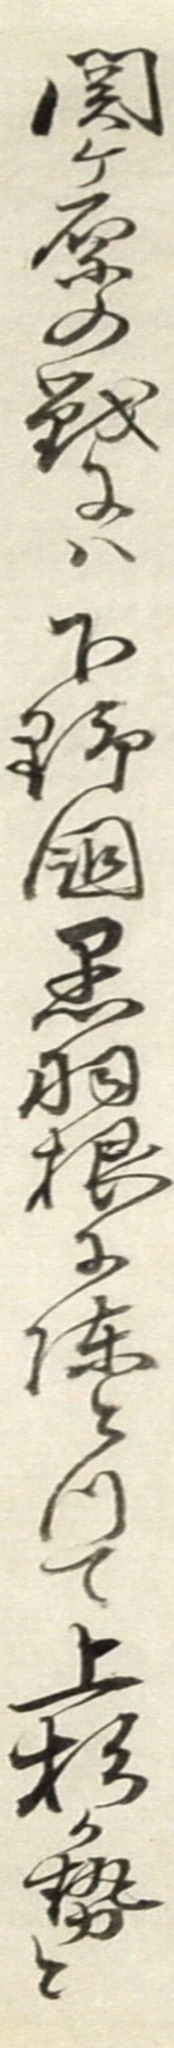関ヶ原の戦には下野国黒羽根に陣とつて上杉か勢と
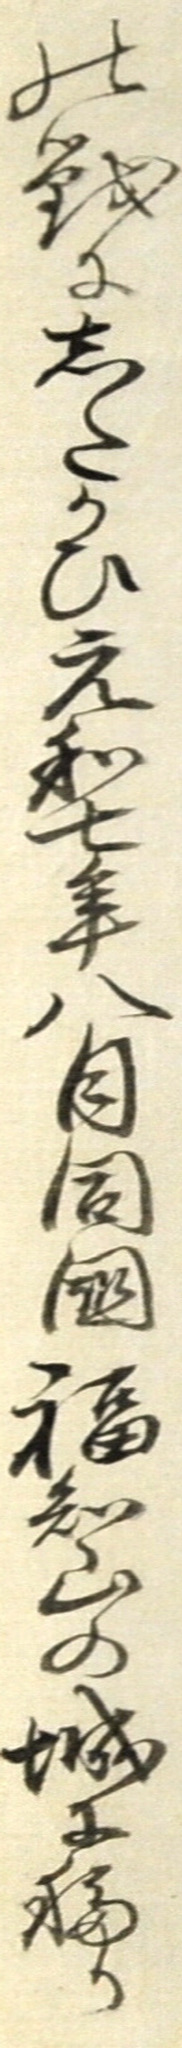の戦にしたかひ元和七年八月同国福知山の城に移り

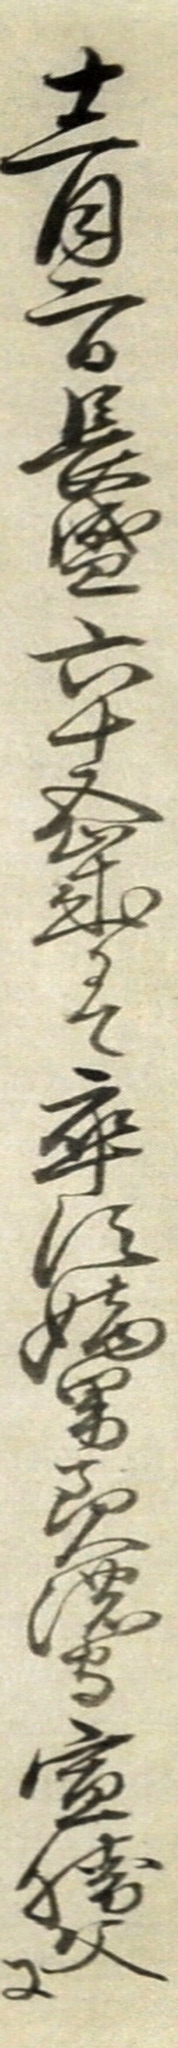十二月二日長盛六十五歳にて卒す嫡男美濃守宣勝父に
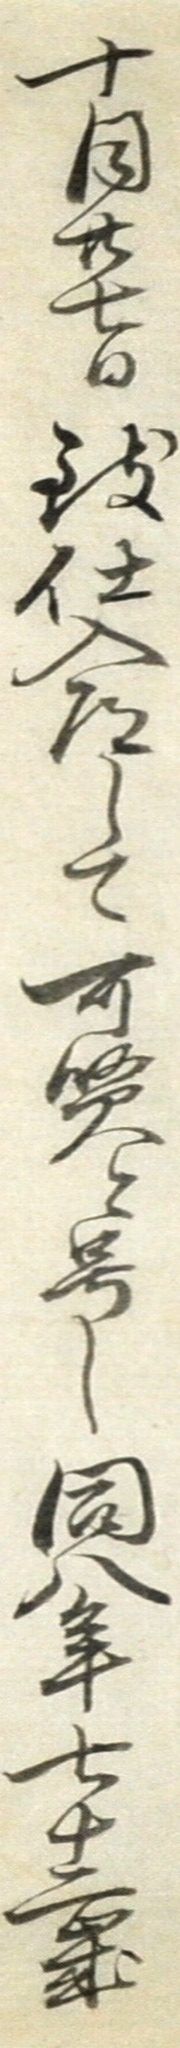十月廿七日致仕入道して可賢と号し同八年七十二歳
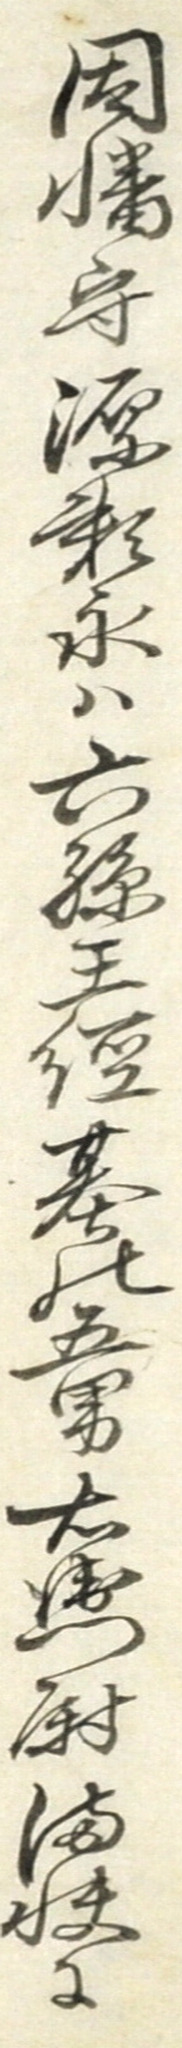因幡守源頼永は六孫王経基の五男右衛門尉満快に
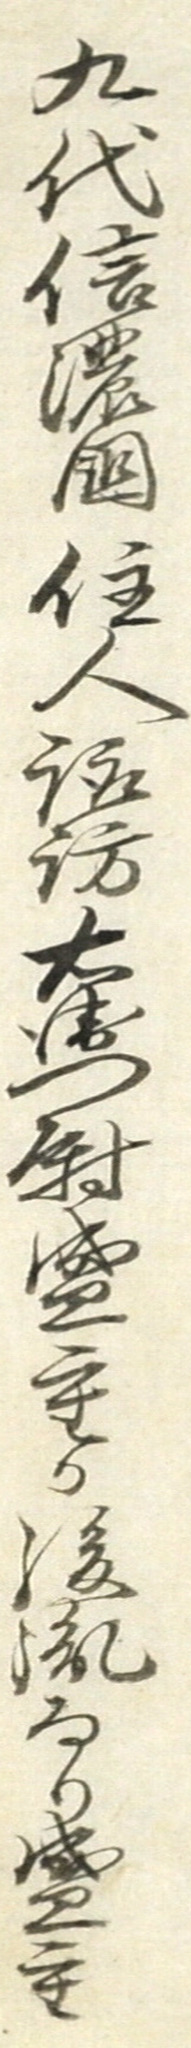九代信濃国住人諏訪右衛門尉盛重か後胤なり盛重
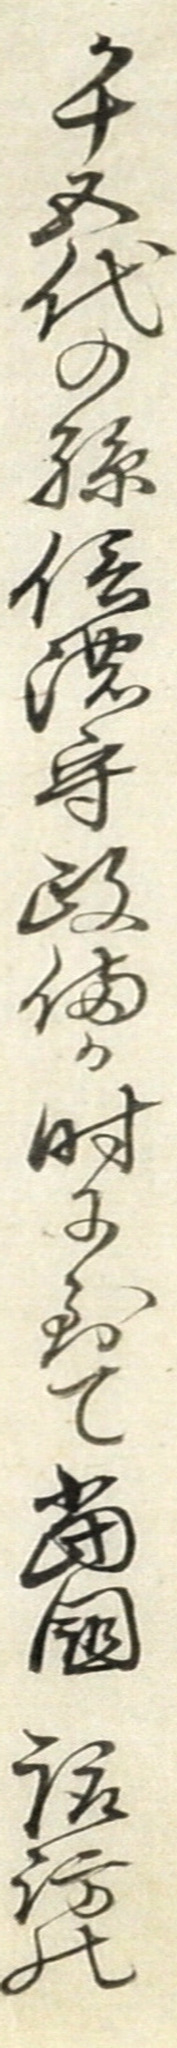か十五代の孫信濃守政満か時に到て当国諏訪の
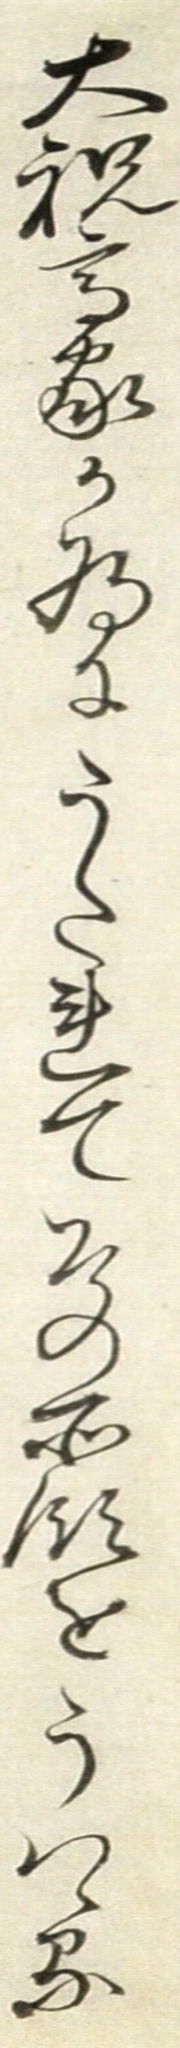大祝高家か為にうたれてその所領をうはゝる
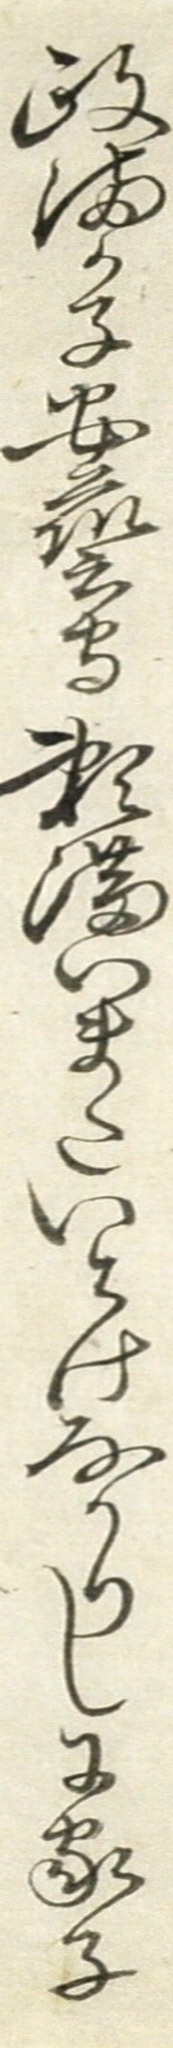政満か子安芸守頼満いまたいとけなかりしに家子
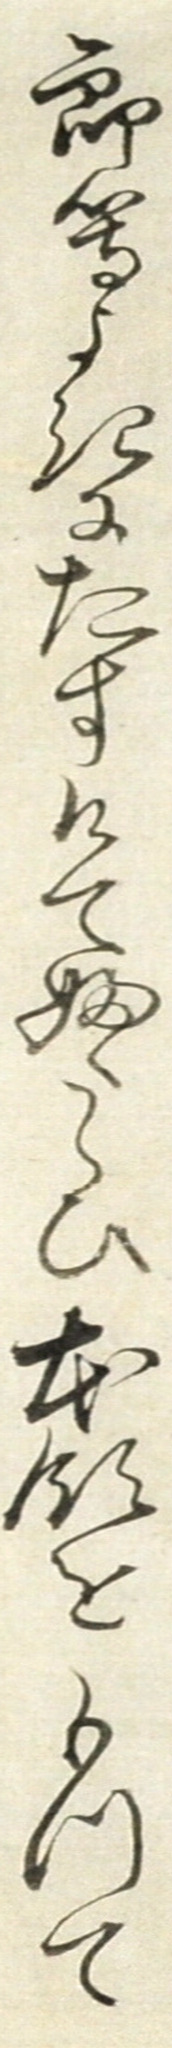郎等よきにたすけてふたゝひ本領をもつて
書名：藩翰譜（六）
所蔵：伊那市立高遠町図書館・合同会社AMANE
